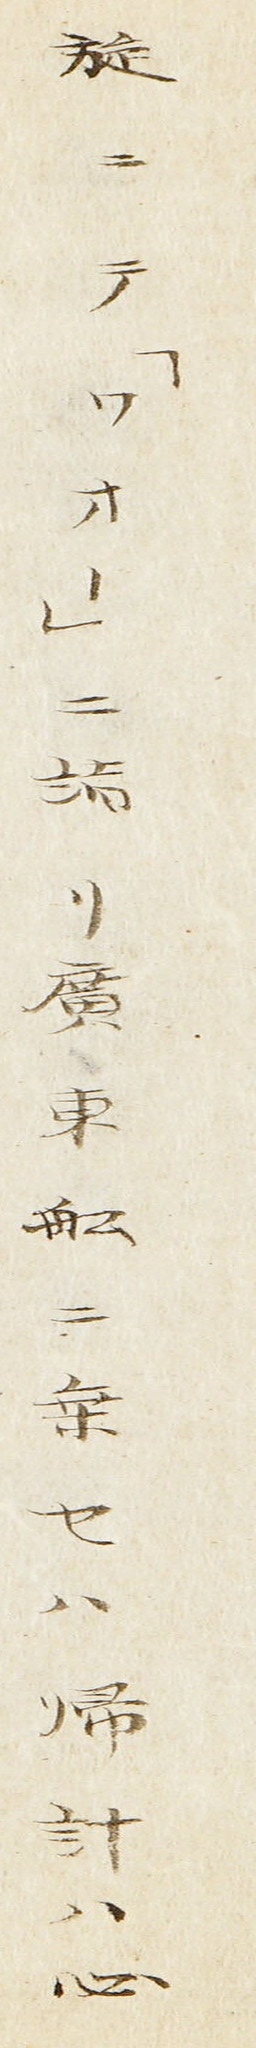旋ニテ「ワオー」ニ詣リ広東船ニ乗セハ帰計ハ必
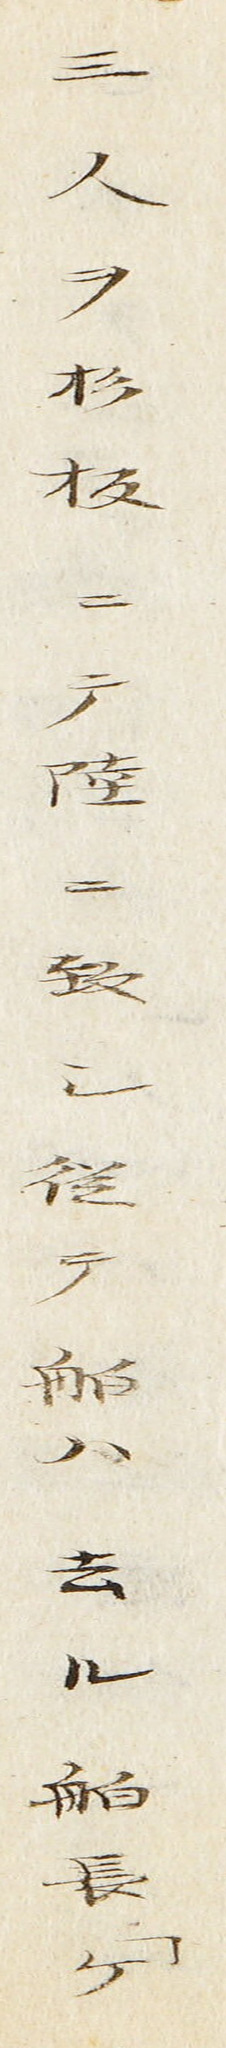三人ヲ杉板ニテ陸ニ致シ従テ舶ハ去ル舶長「ケ
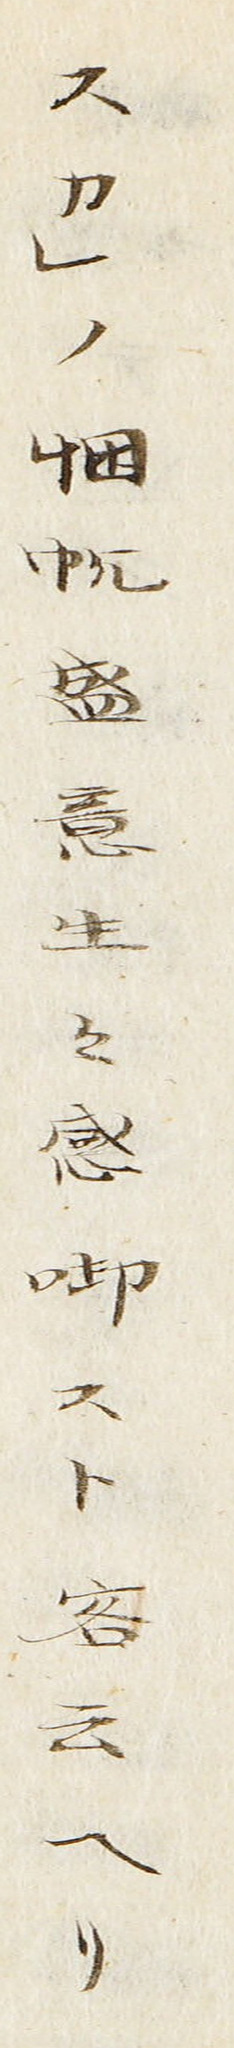スカ」ノ悃忱盛意生々感啣スト客云ヘリ
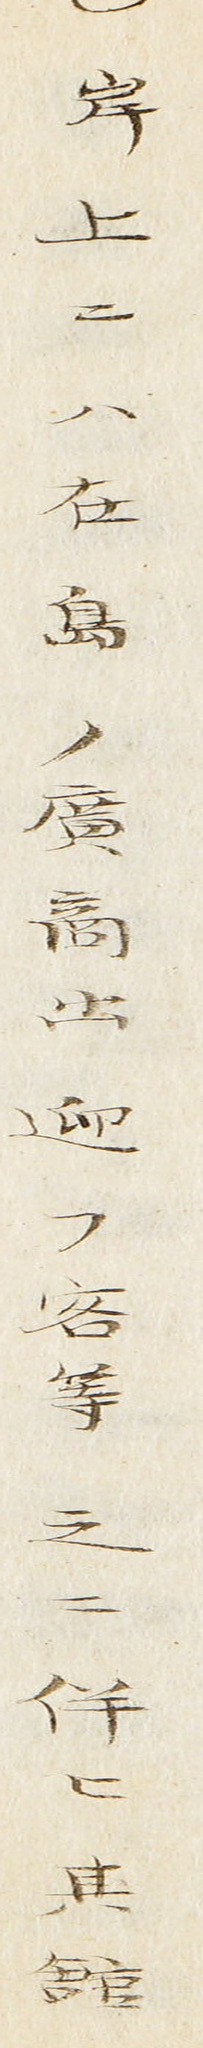○岸上ニハ在島ノ広商出迎フ客等之ニ伴ヒ其館
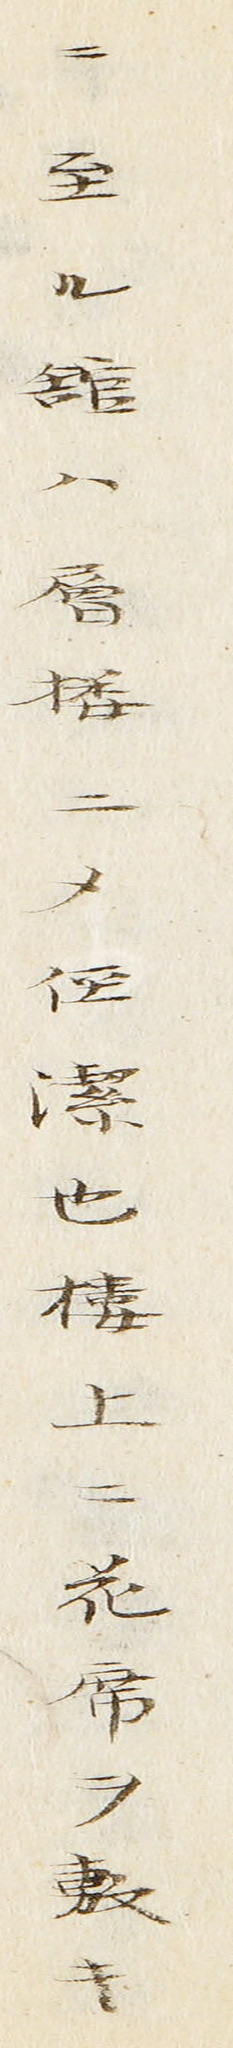ニ至ル館ハ層楼ニシテ俓潔也楼上ニ花席ヲ敷キ
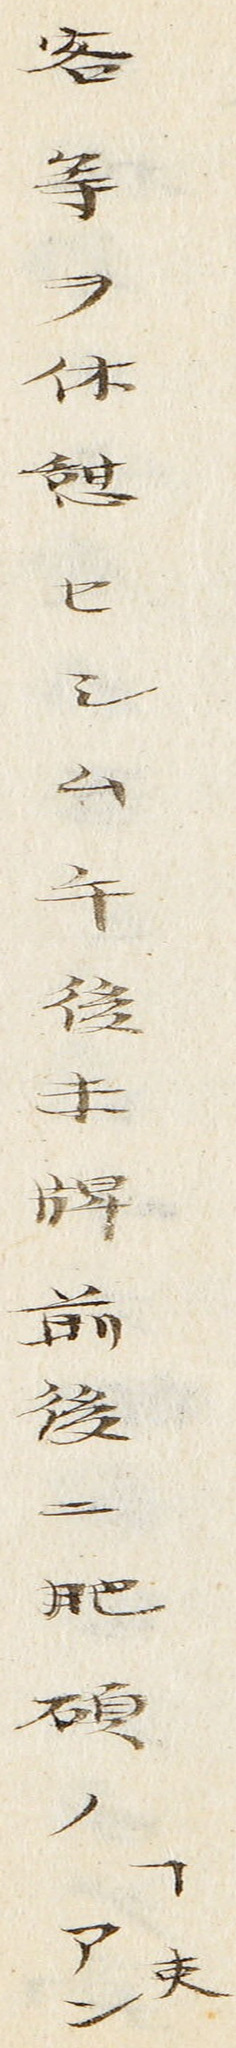客等ヲ休憩セシム午後未牌前後ニ肥碩ノ「アン
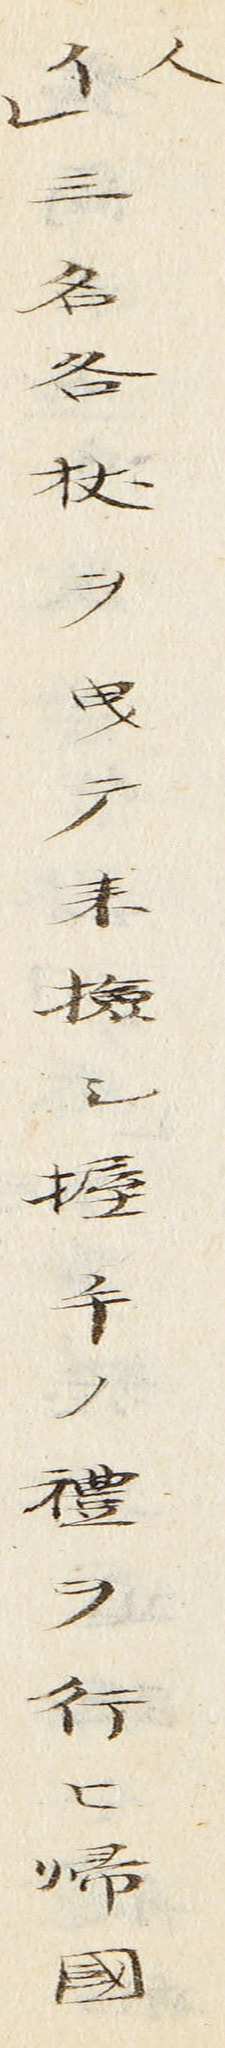イ」三名各杖ヲ曳テ来撿シ握手ノ礼ヲ行ヒ帰国
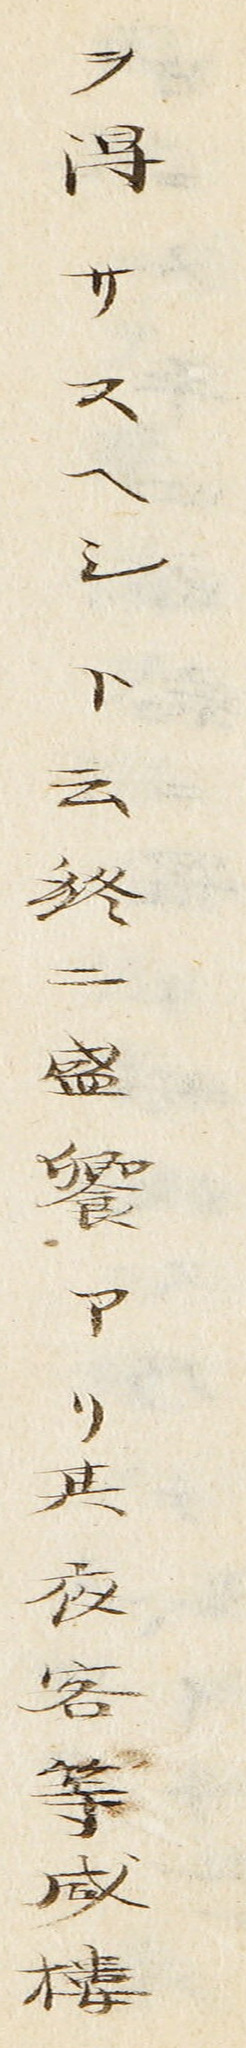ヲ得サスヘシト云終ニ盛饗アリ其夜客等咸楼
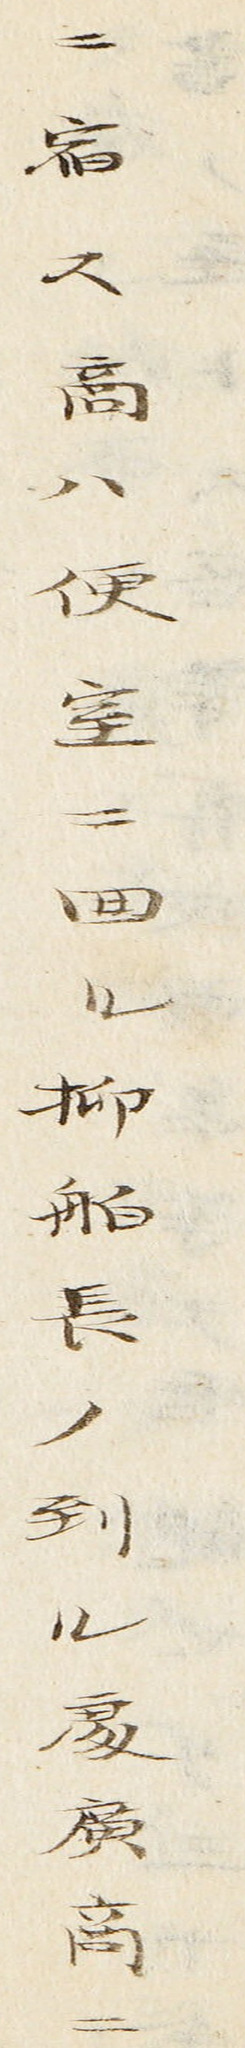ニ宿ス商ハ便室ニ回ル抑舶長ノ到ル処広商ニ
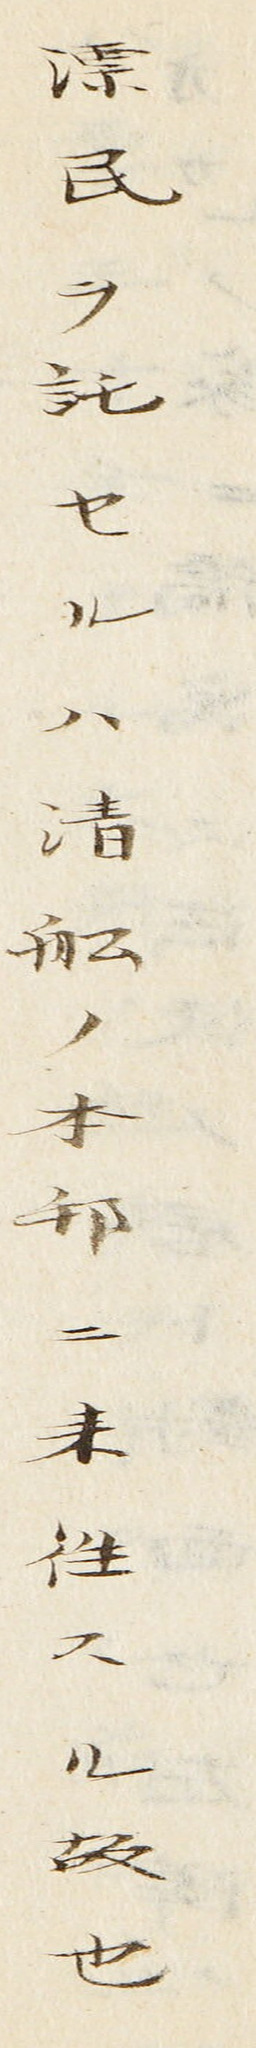漂民ヲ託セルハ清船ノ本邦ニ来往スル故也
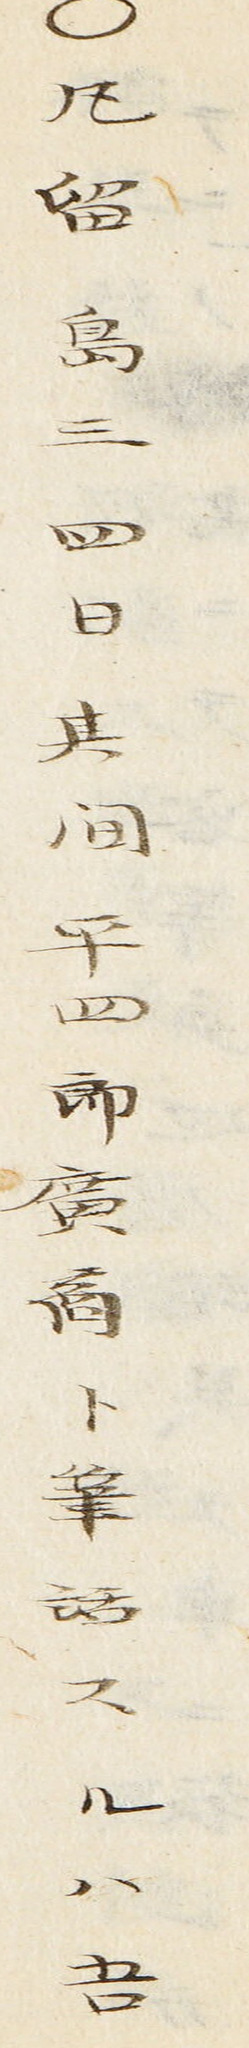○凡留島三四日其間平四郎広商ト筆話スルハ吾
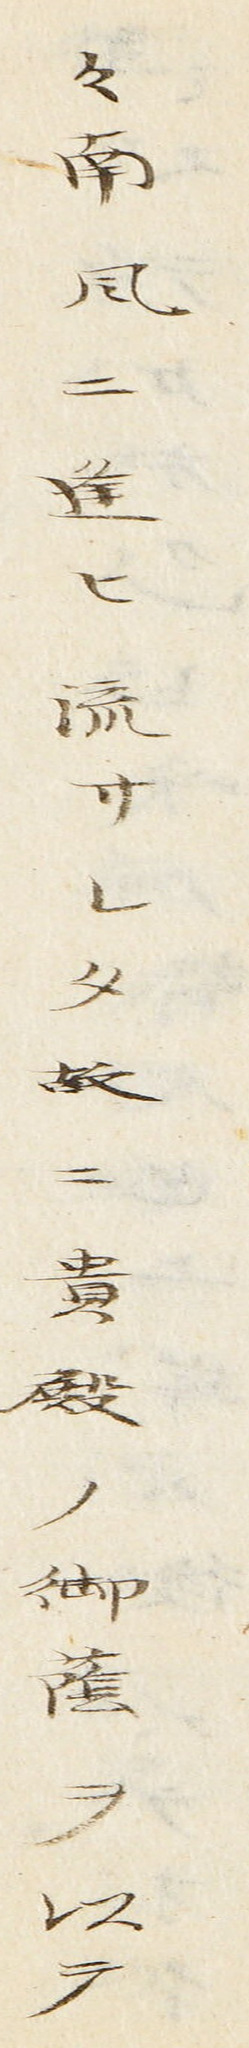々南風ニ逢ヒ流サレタ故ニ貴殿ノ御蔭ヲ以テ
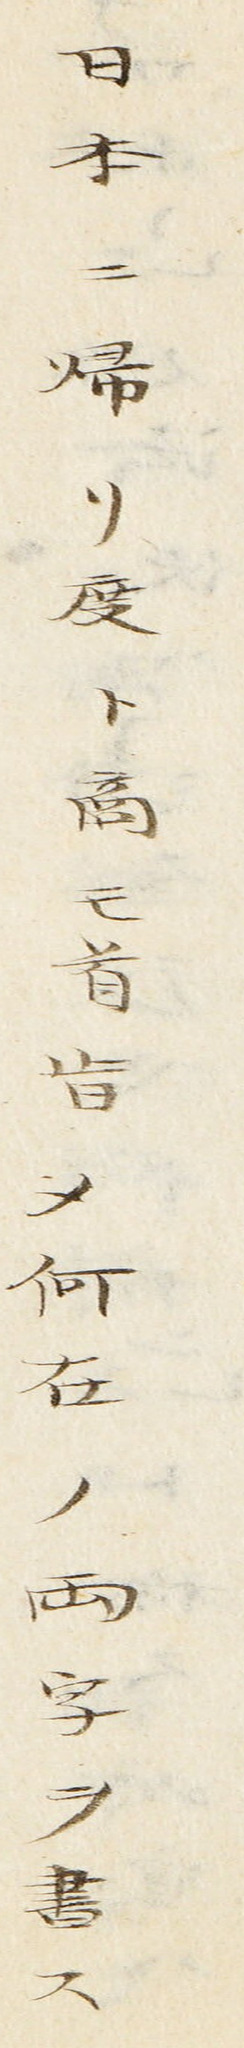日本ニ帰リ度ト商モ首肯シテ何在ノ両字ヲ書ス
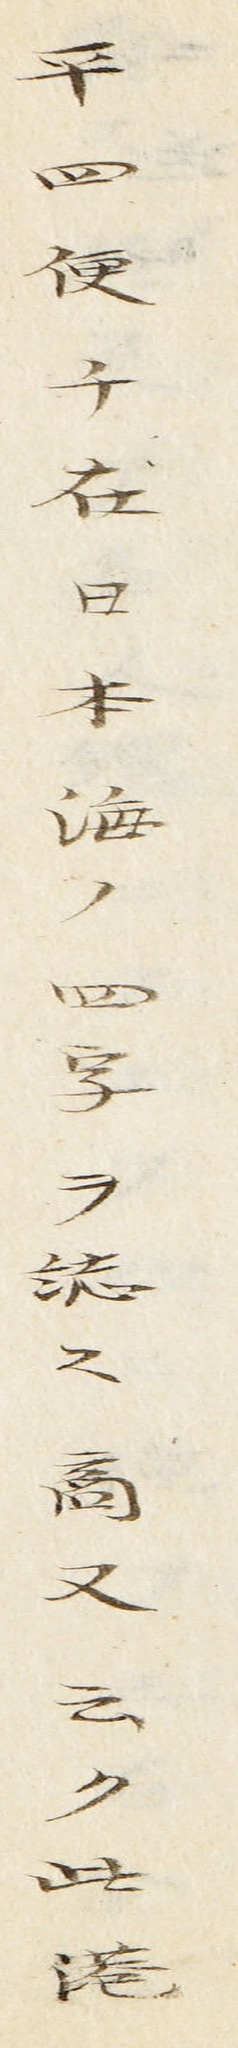平四便チ在日本海ノ四字ヲ誌ス商又云ク此港
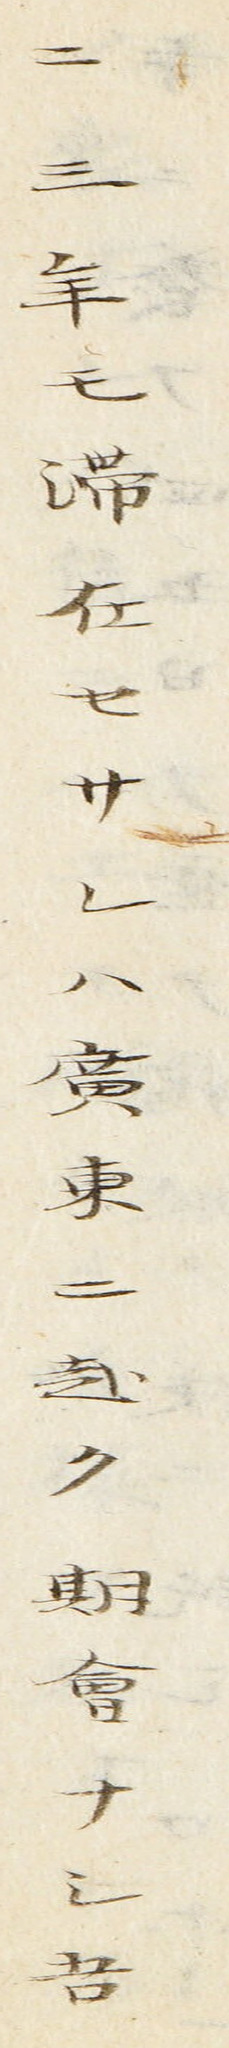ニ三年モ滞在セサレハ広東ニ赴ク期会ナシ吾
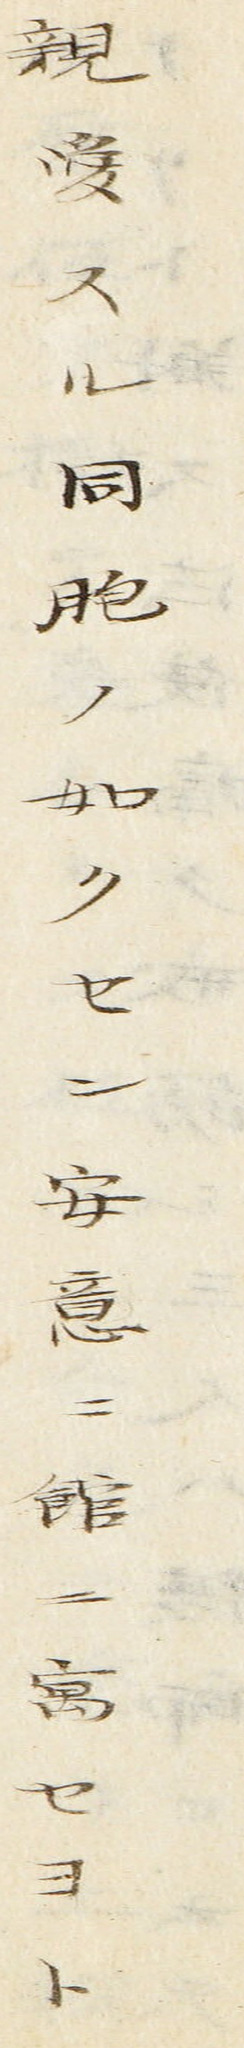親愛スル同胞ノ如クセン安意ニ館ニ寓セヨト
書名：流蕃通書
